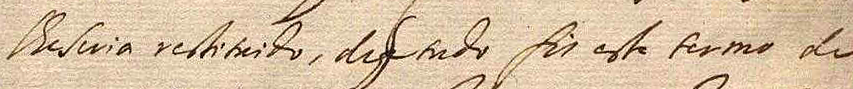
lhe seria restituido, de q̄ tudo fis este termo de
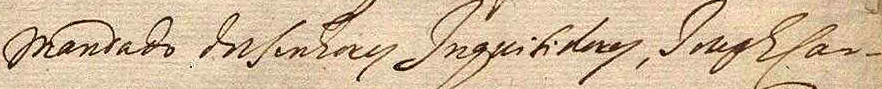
mandado dos Senhores Inquisidores, Ioseph Car
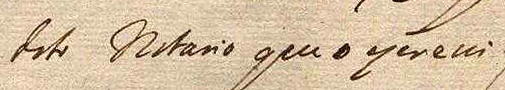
doso Notario que o escreui
